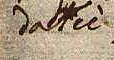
da Feè
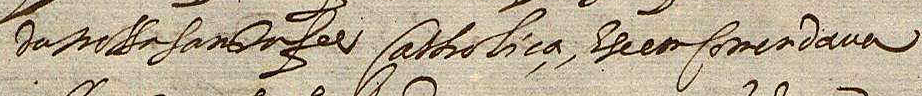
da nossa sancta fee Catholica, E se emComendaua
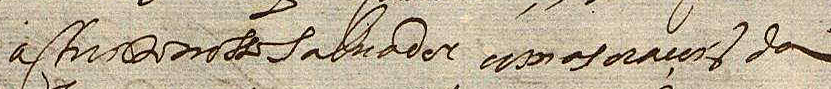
a Christo nosso Saluador com as oraçois da
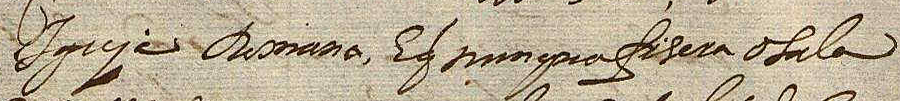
Igreja Romana, E q̄ nunqua fisera o sala
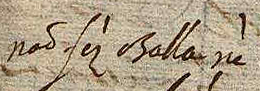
naõ fez o salla nē
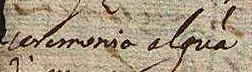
ceremonia alguā
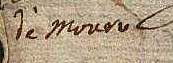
de Mouro
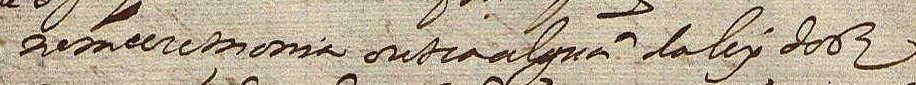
nem ceremonia outra alguā da ley dos
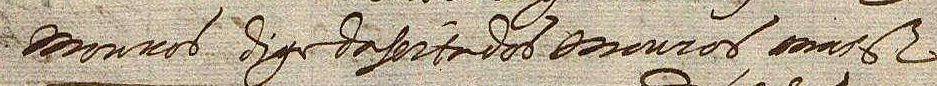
mouros digo da seita dos mouros mais
